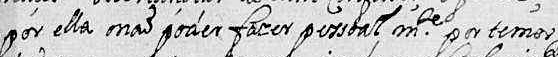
por ella o naõ poder fazer pessoalm.te por temor
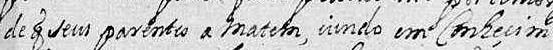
de q̄ seus parentes a matem, uindo em Conhecimto.
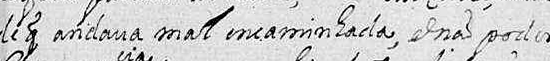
de q̄ andaua mal encaminhada, e naõ poder
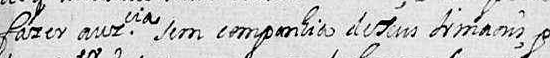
fazer auz.cia sem companhia de seus Irmaons, por
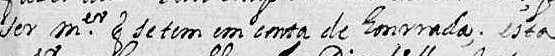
ser m.er q̄ se tem em conta de honrrada; esta
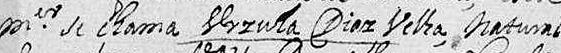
m.er se chama Vrzula Diaz Velha, natural
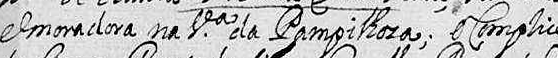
e moradora na V.a da Pampilhoza; E Complice
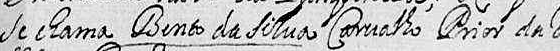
se chama Bento da Silua Carualho Prior da d.
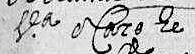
V.a o Cazo he
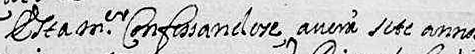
Esta m.er Confessandose, auerá sete annos,
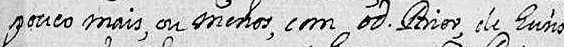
pouco mais, ou menos, com o d. Prior, de huns
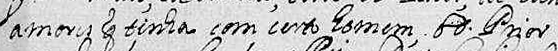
amores q̄ tinha com certo homem, o d. Prior a
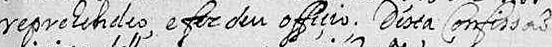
reprehendeo, e fez seu offiçio, desta Confissaõ
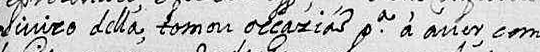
a iuizo della, tomou occaziaõ p.a á auer, como
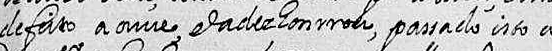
de feito a ouue, e a dezhonrrou, passado isto a
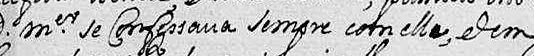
d. m.er se Confessaua sempre com ella, e em
